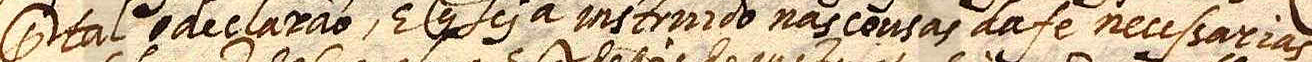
p̄ tal o declarão, E q̄ seja instruido nas cousas da fe necessarias
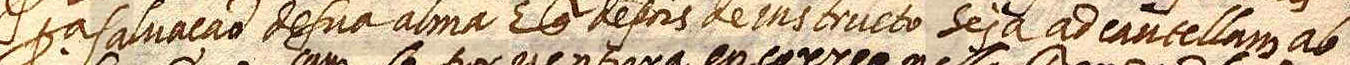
p̄.a Saluação de sua alma E q̄ depois de instructo seja ad cautellam ab
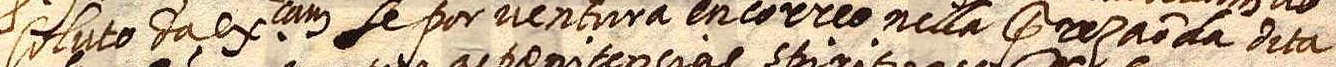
soluto da ex.çam se por uentura encorreo nella p̄ rezaõ da dita
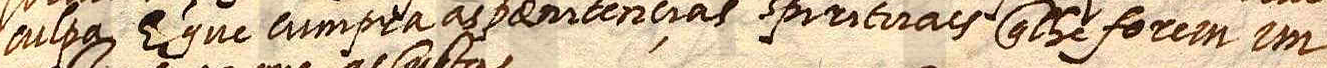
culpa E q̄ cumpra as pœnitencias spirituaes q̄ lhe forem im
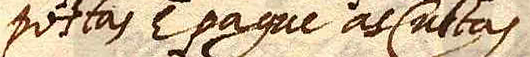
postas E pague as Custas
